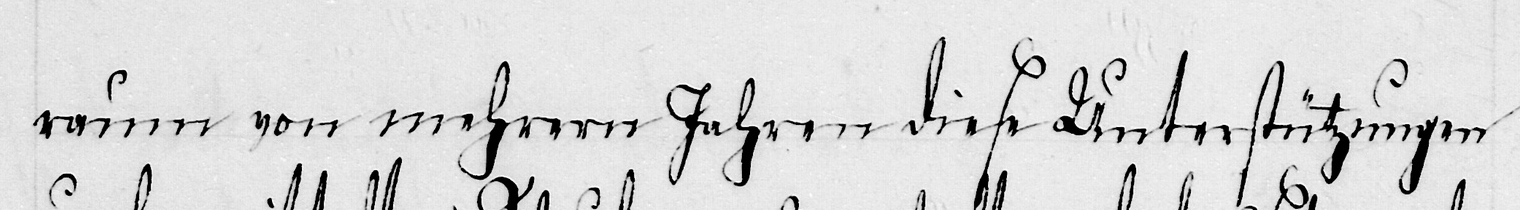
raum von mehrern Jahren diese Unterstützungen
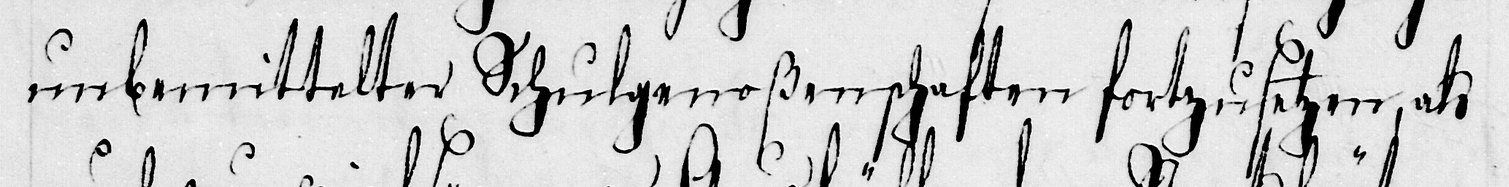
unbemittelter Schulgenoßenschaften fortzusetzen, als
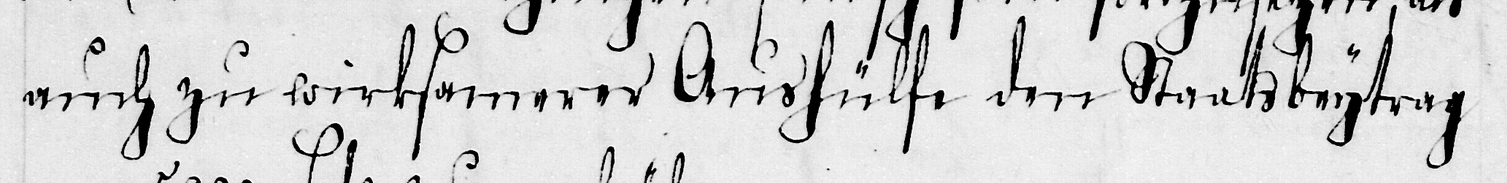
auch zu wirksamerer Aushülfe den Staatsbeytrag
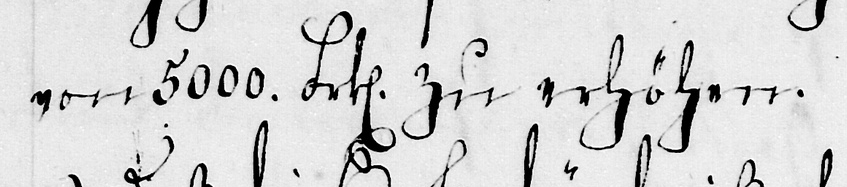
von 5000. Frk[en]. zu erhöhen.
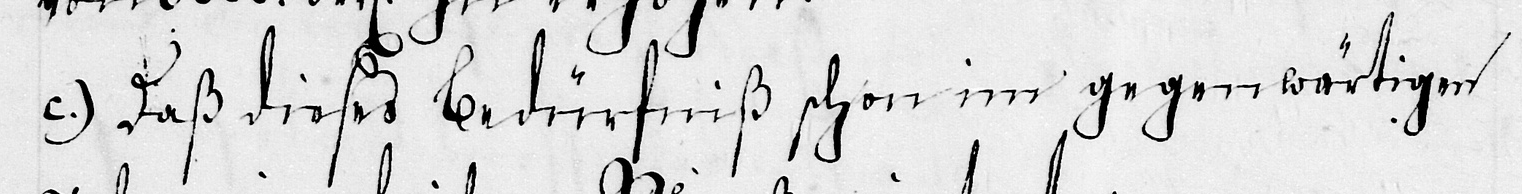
c.) Daß dieses Bedürfniß schon im gegenwärtigen
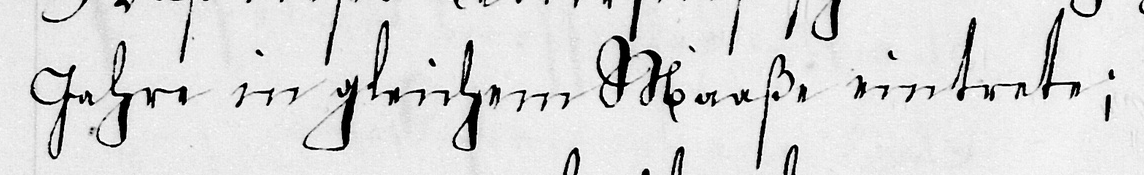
Jahre in gleichem Maaße eintrete;
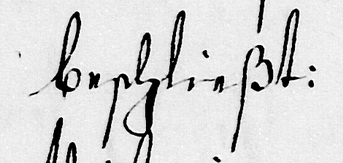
beschließt:
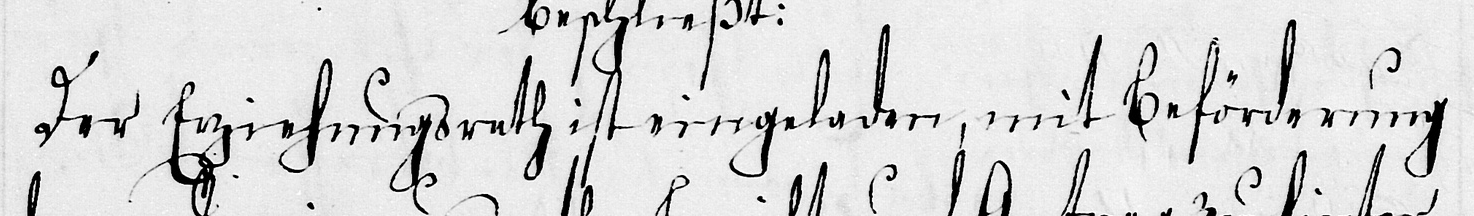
Der Erziehungsrath ist eingeladen, mit Beförderung
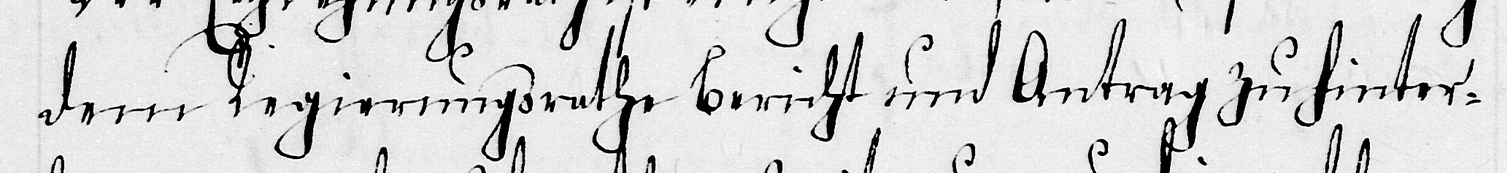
dem Regierungsrathe Bericht und Antrag zu hinter¬
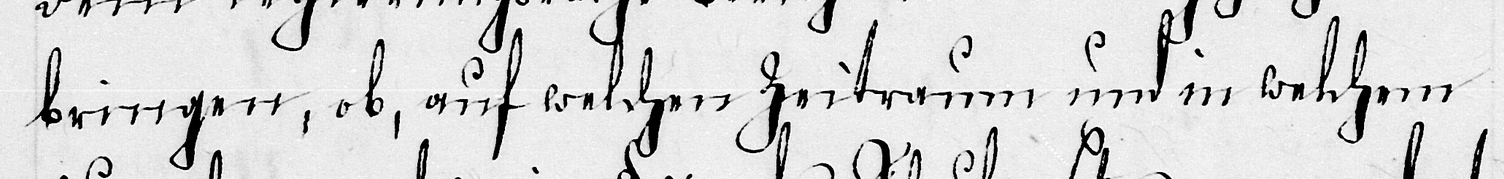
bringen, ob, auf welchen Zeitraum und in welchem
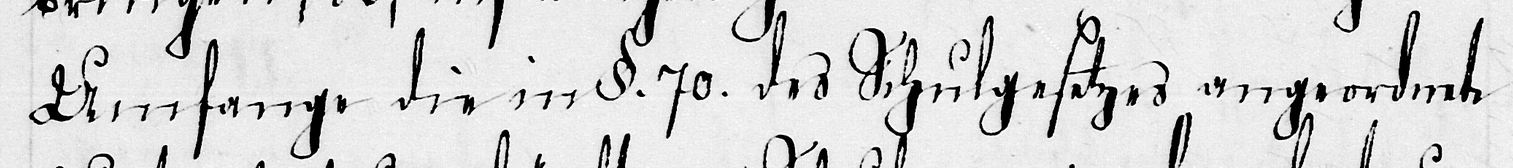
Umfange die in §. 70. des Schulgesetzes angeordnete
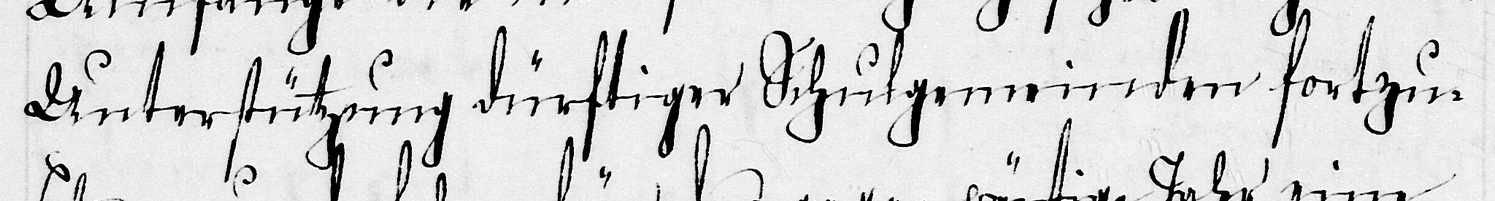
Unterstützung dürftiger Schulgemeinden fortzu¬
